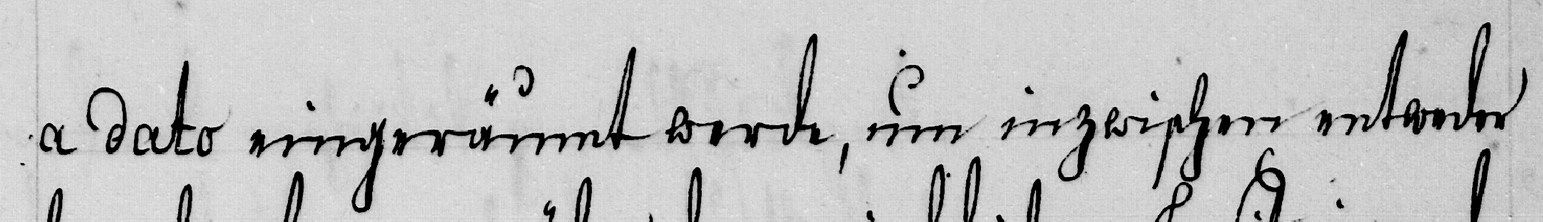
a dato eingeräumt werde, um inzwischen entweder
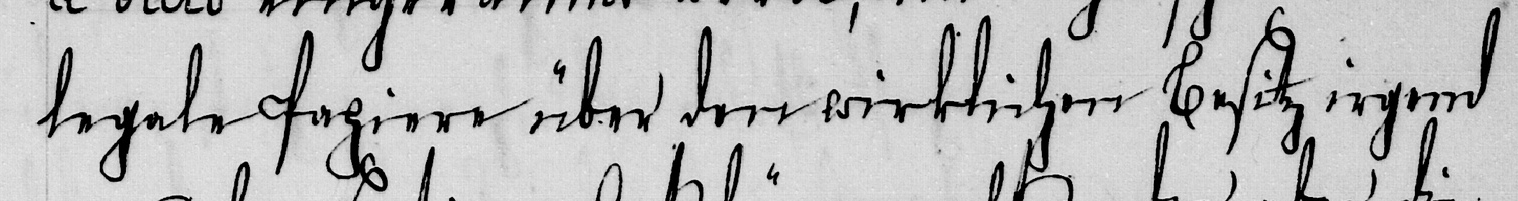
legale Papiere über den wirklichen Besitz irgend
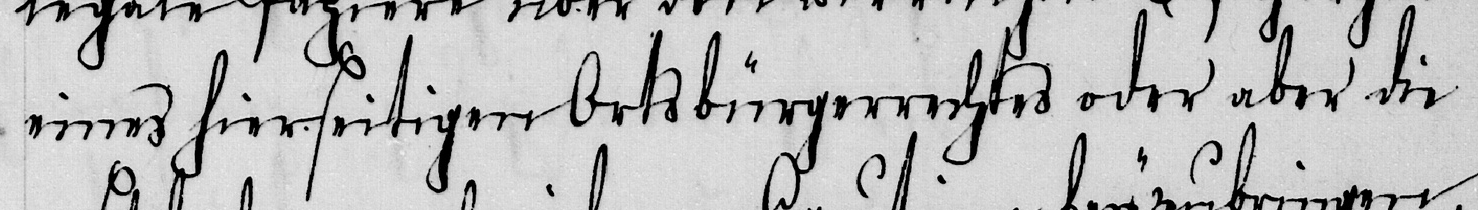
eines hierseitigen Ortsbürgerrechtes oder aber die
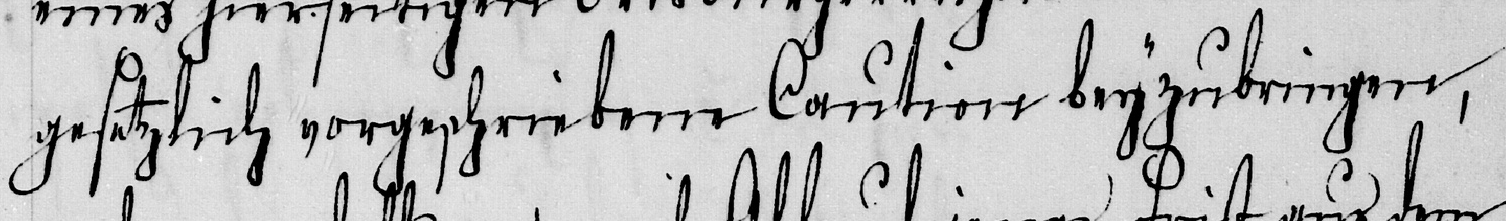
gesetzlich vorgeschriebene Caution beyzubringen,
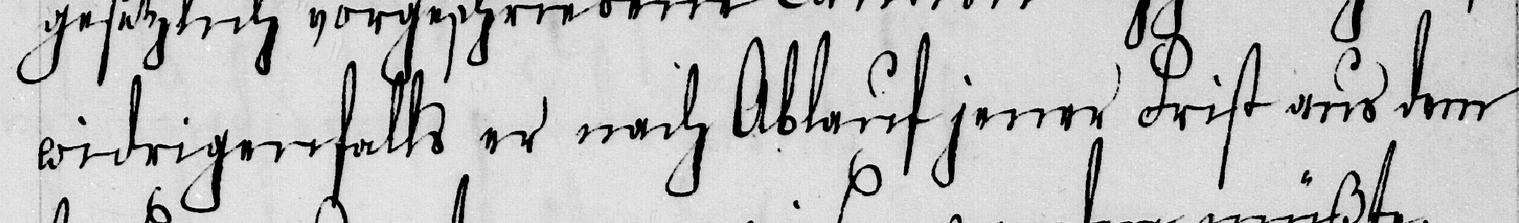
widrigenfalls er nach Ablauf jener Frist aus dem
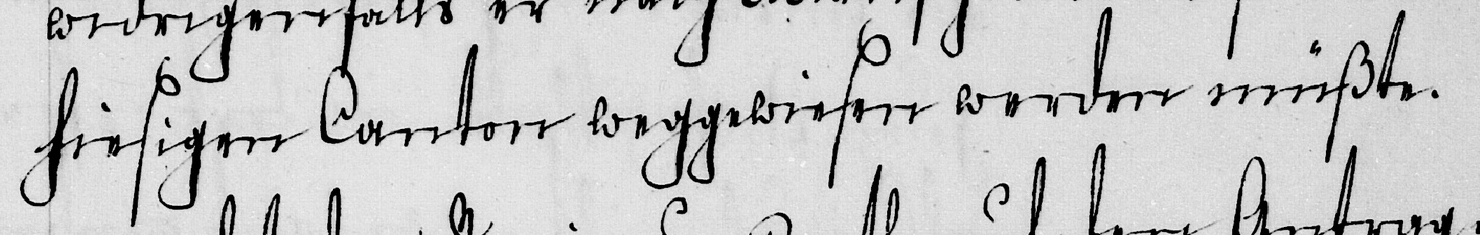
hiesigen Canton weggewiesen werden müßte.
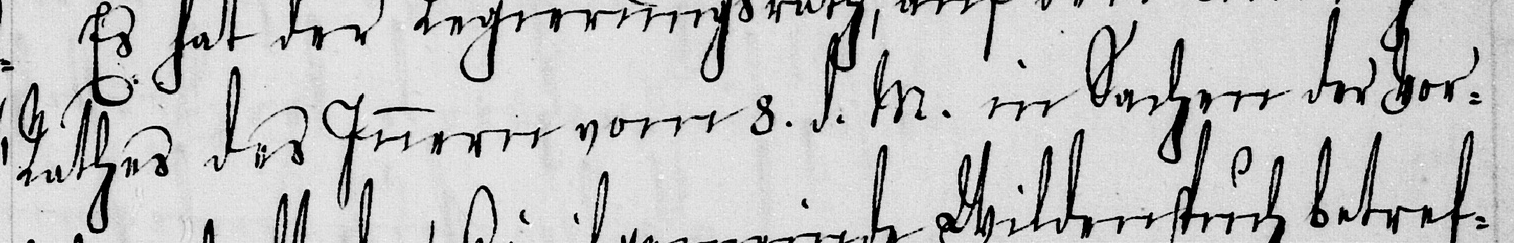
Rathes des Innern vom 8. d. M. in Sachen der Vors¬
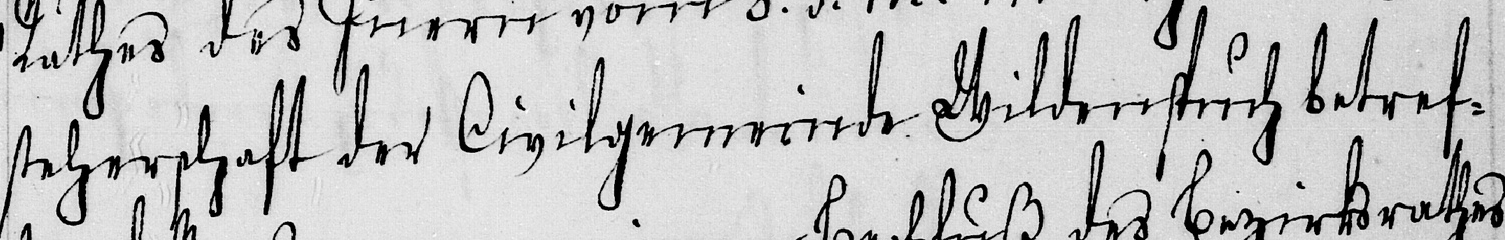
teherschaft der Civilgemeinde Wildenspuch betref¬
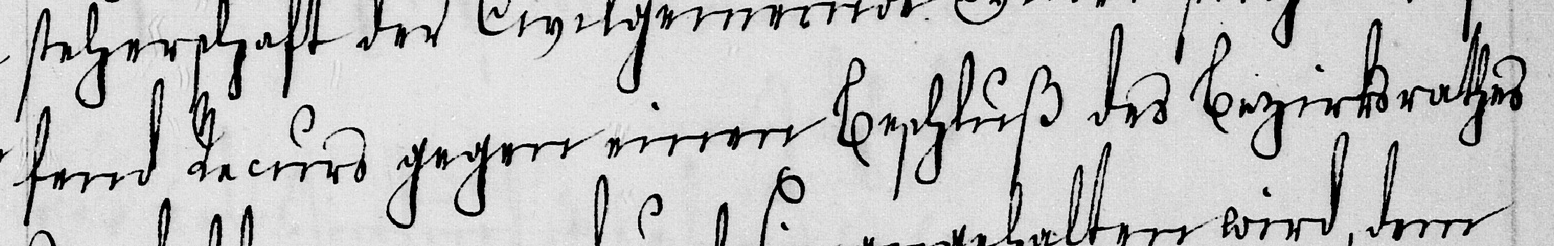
fend Recurs gegen einen Beschluß des Bezirksrathes
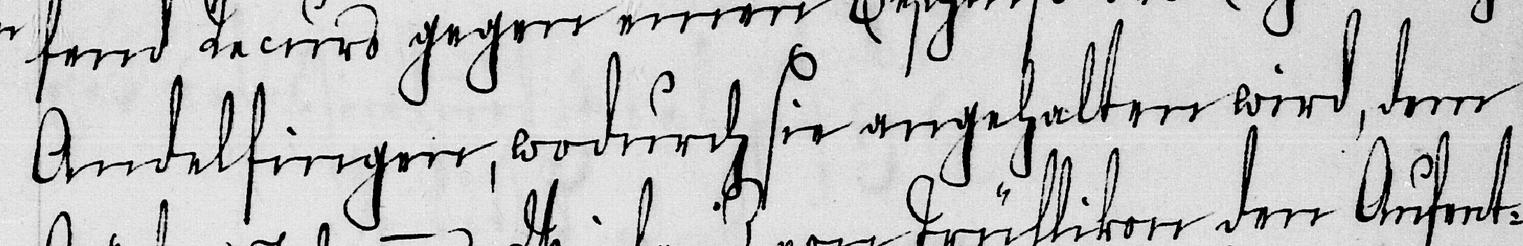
Andelfingen, wodurch sie angehalten wird, dem
